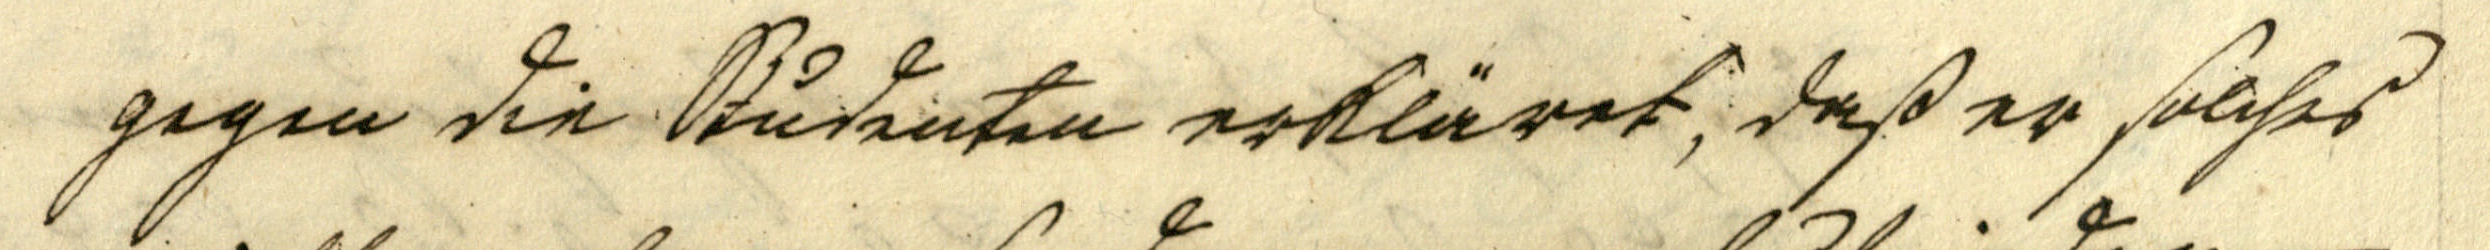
gegen die Studenten erkäret, daß er solches
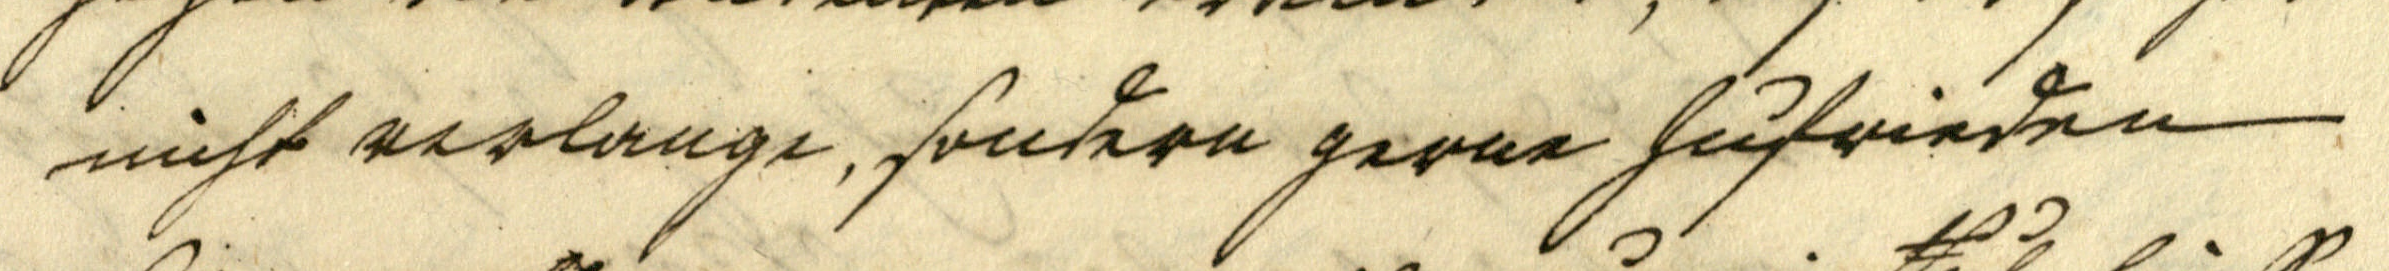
nicht verlange, sondern gerne zufrieden
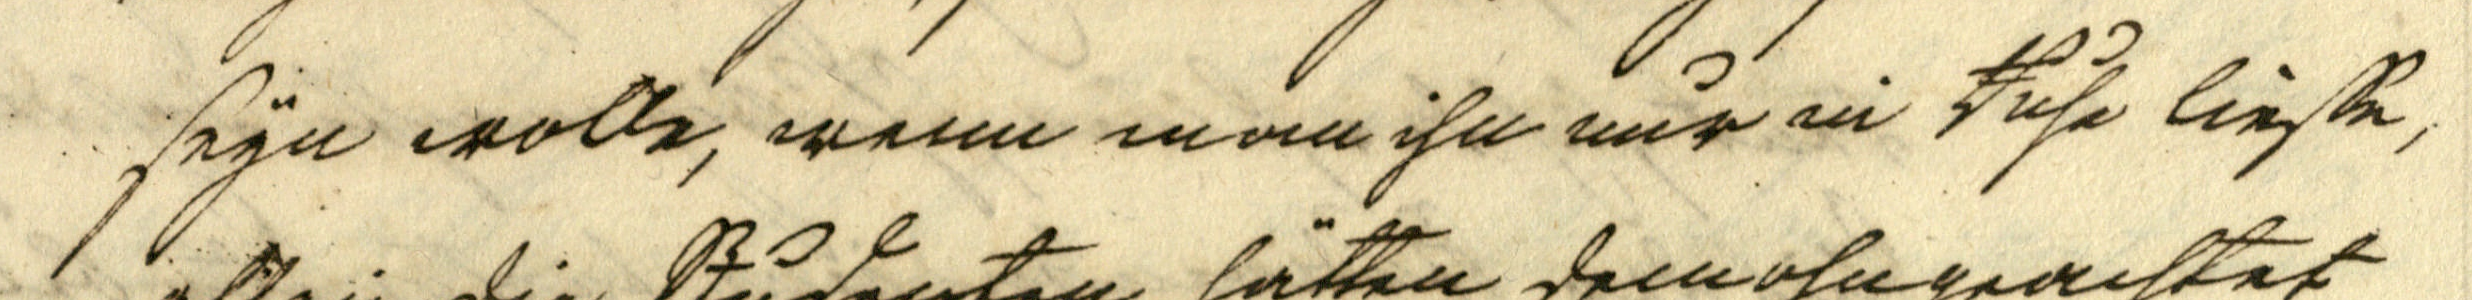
seyn wolle, wenn man ihn nur in Ruhe liesse,
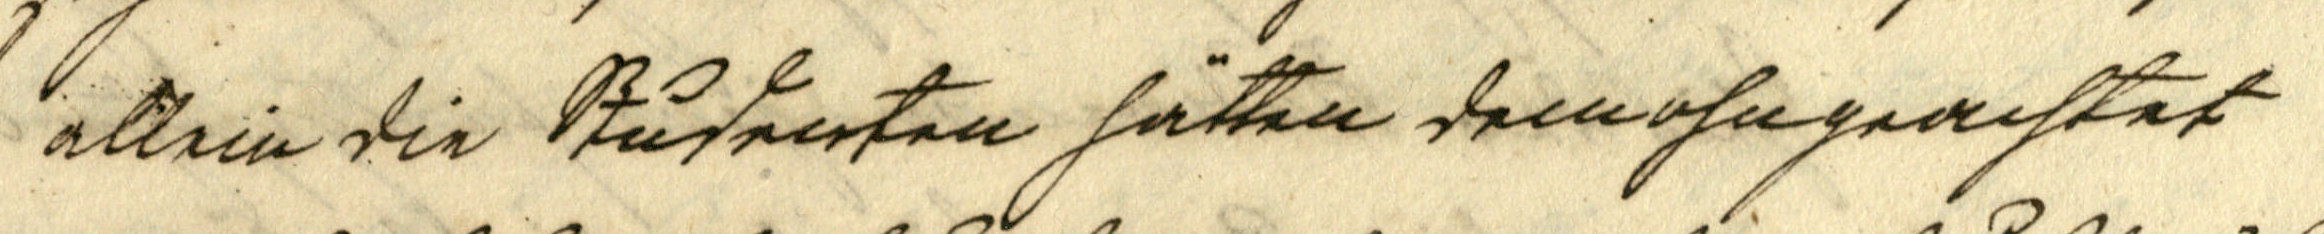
allein die Studenten hätten demohngeachtet
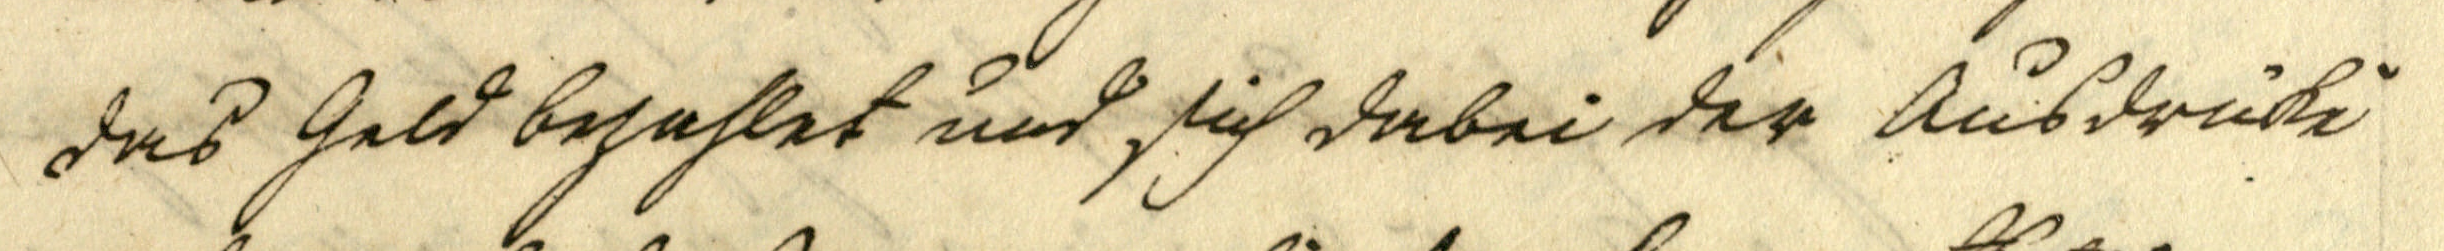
das Geld bezahlet und sich dabei der Ausdrücke
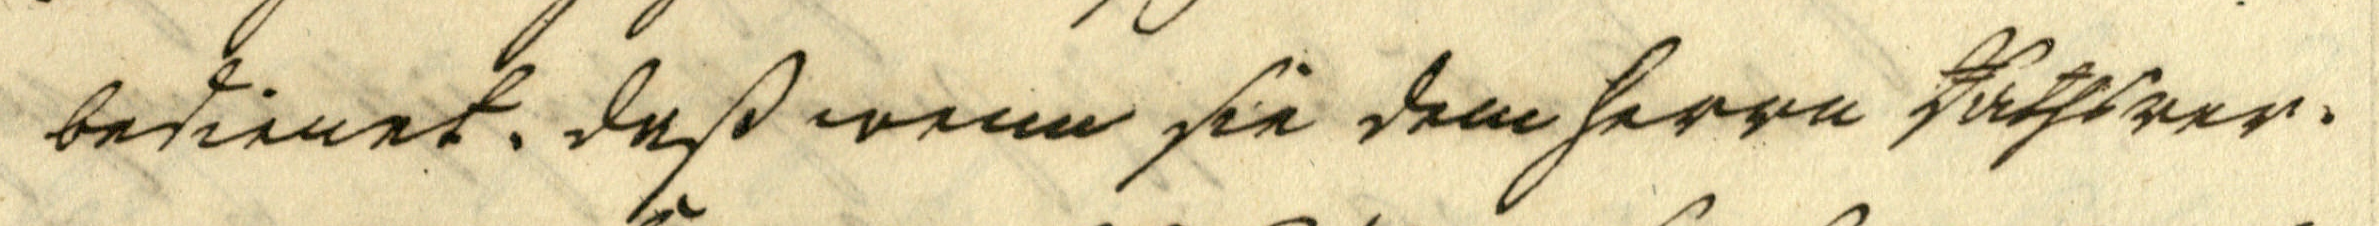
bedienet, daß wenn sie dem Herrn Rathsver-
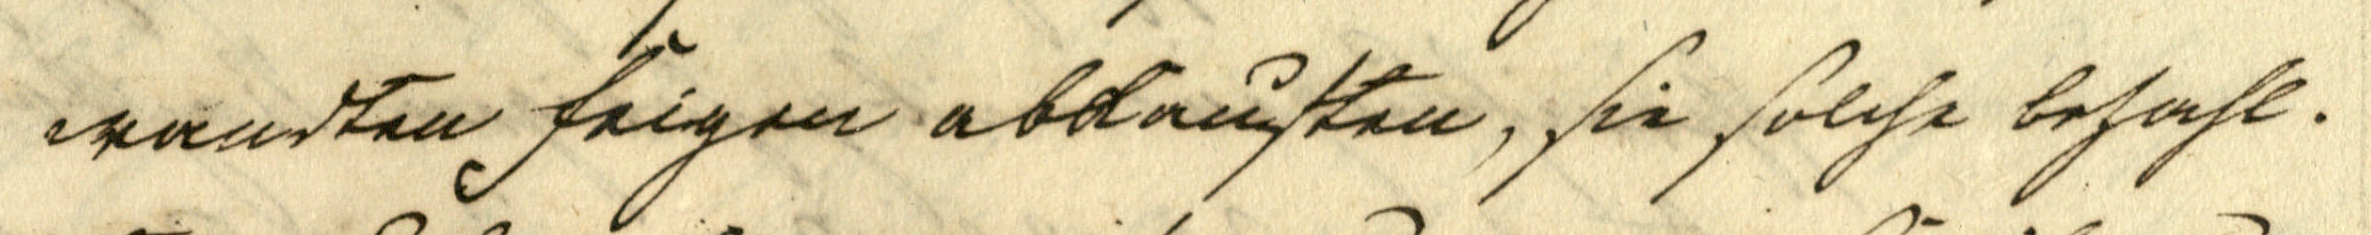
wandten Feigen abkauften, sie solche bezahl-
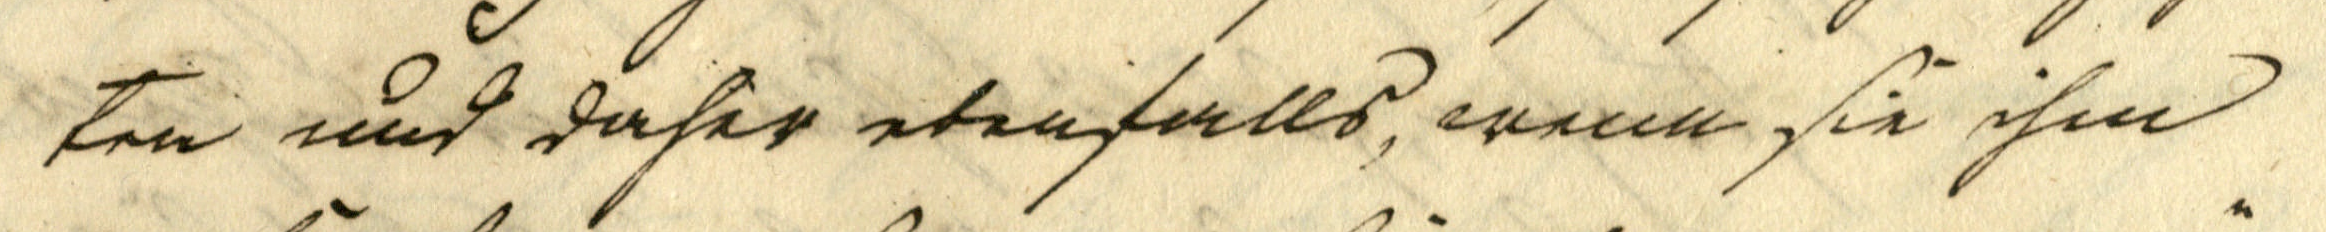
ten und daher ebenfalls, wenn sie ihm
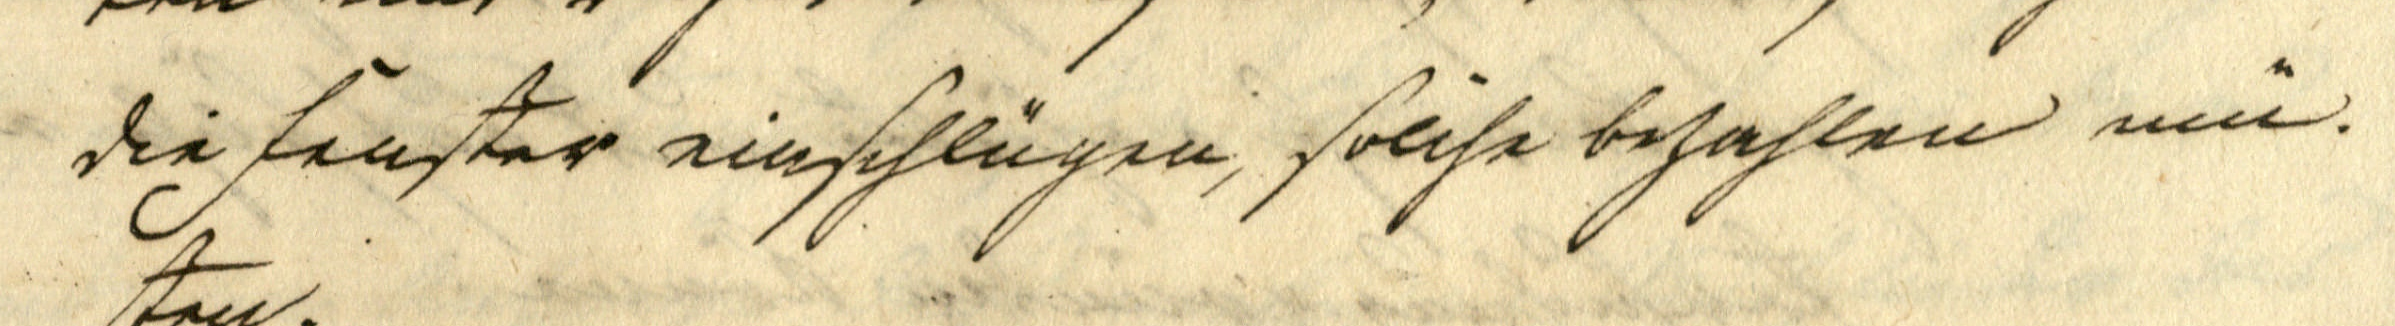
die Fenster einschlügen, solche bezahlen mü-
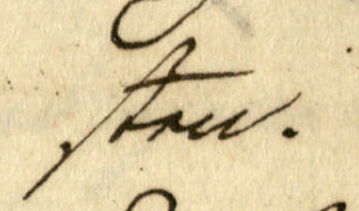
sten.
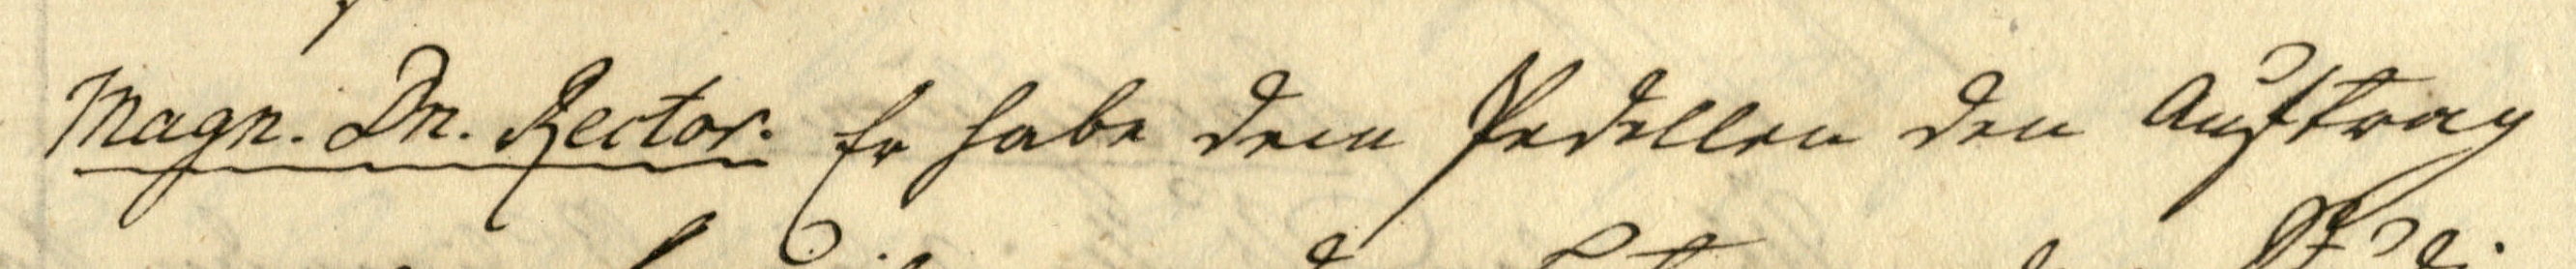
Magn. Dn. Rector. Er habe dem Pedellen den Auftrag
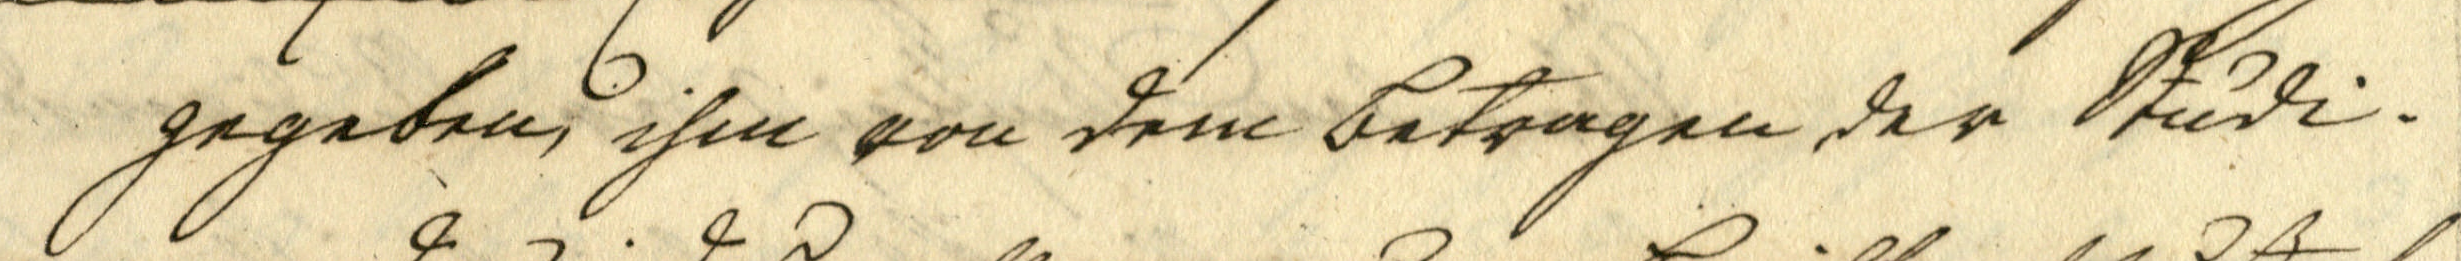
gegeben, ihm von dem Betragen der Studi-
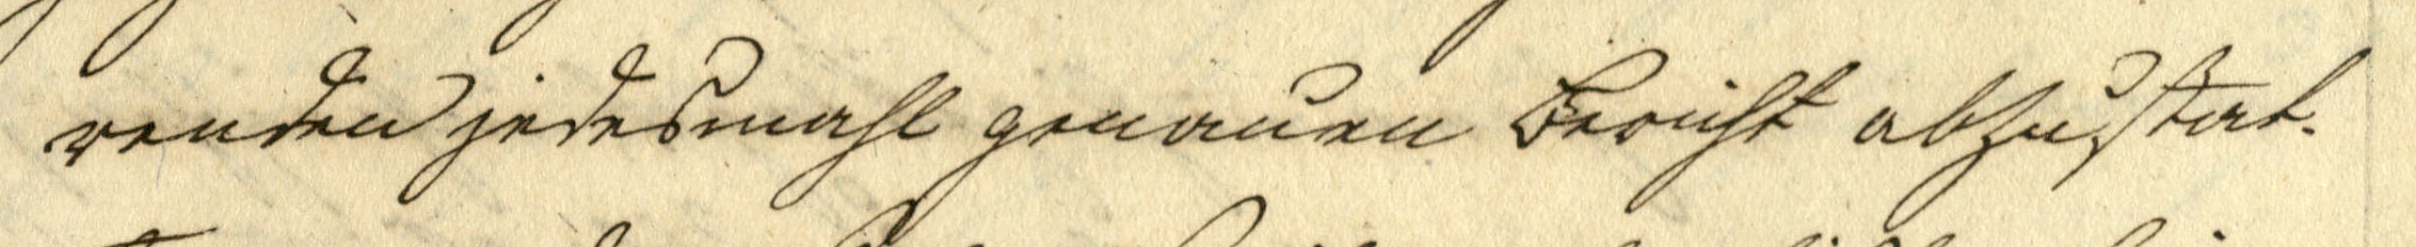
renden jedesmahl genauen Bericht abzustat-
